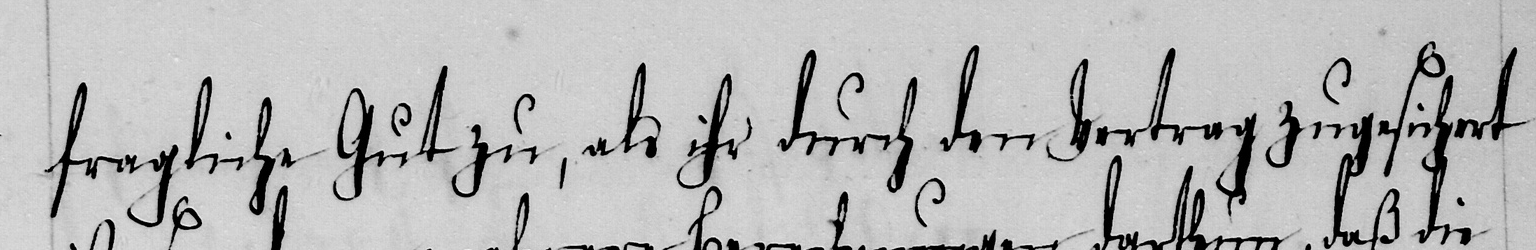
fragliche Gut zu, als ihr durch den Vertrag zugesiche¬
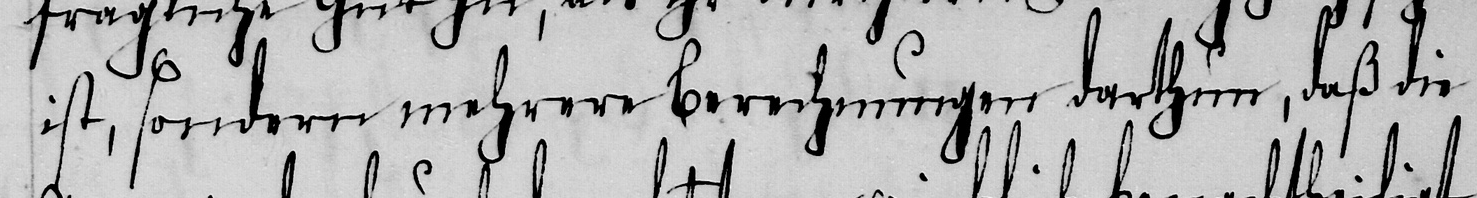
ist, sondern mehrere Berechnungen darthun, daß die
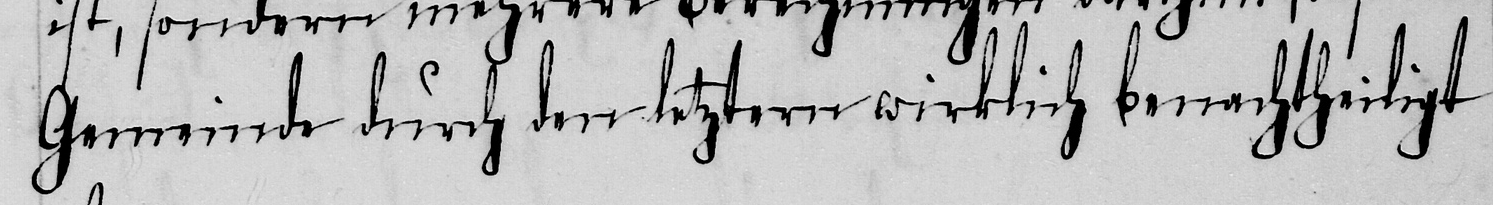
Gemeinde durch den letztern wirklich benachtheiligt
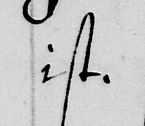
ist.
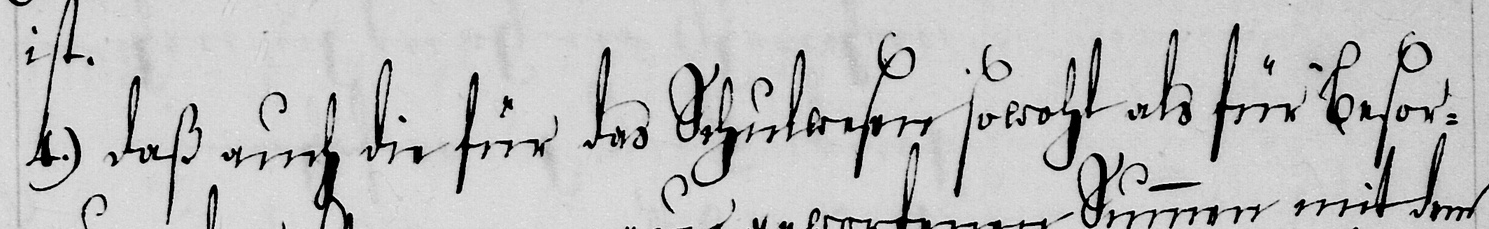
4.) daß auch die für das Schulwesen sowohl als für Beso¬
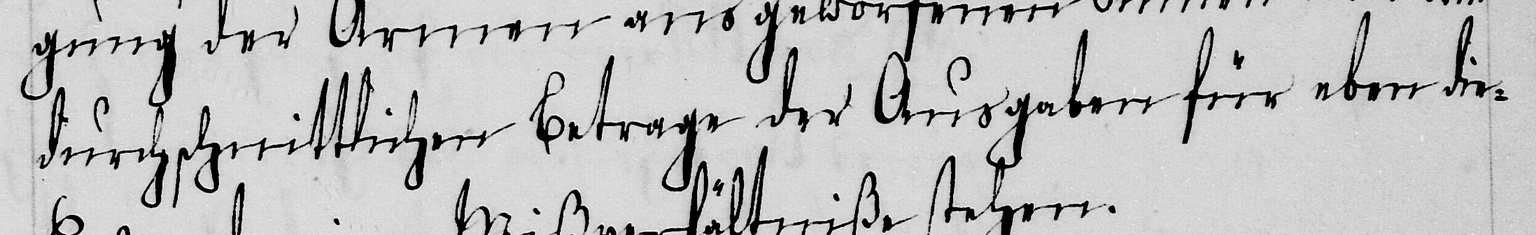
durchschnittlichen Betrage der Ausgaben für eben die¬
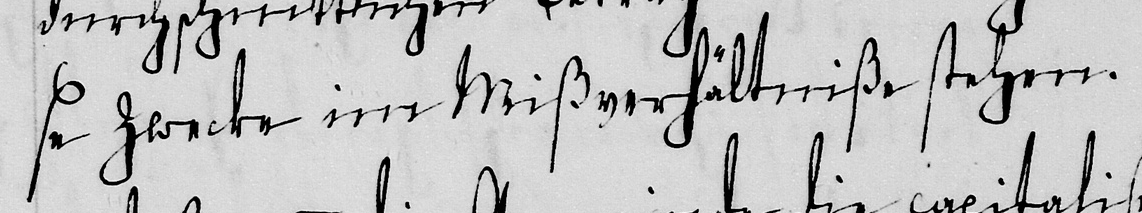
se Zwecke im Mißverhältniße stehen.
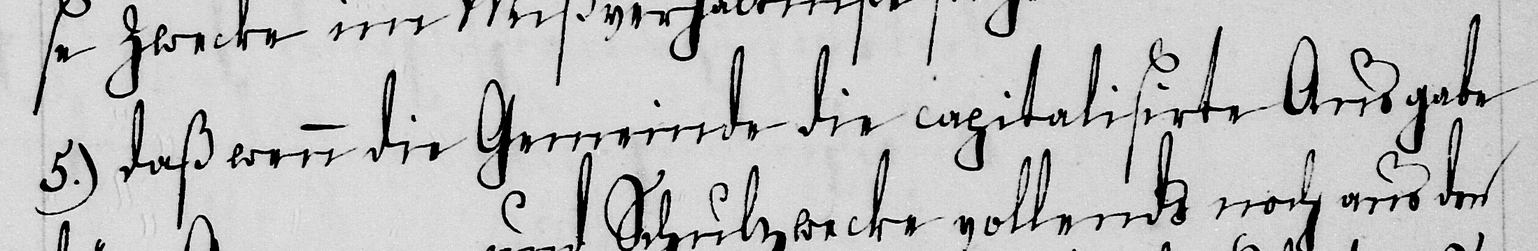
5.) daß wenn die Gemeinde die capitalisirte Ausgabe
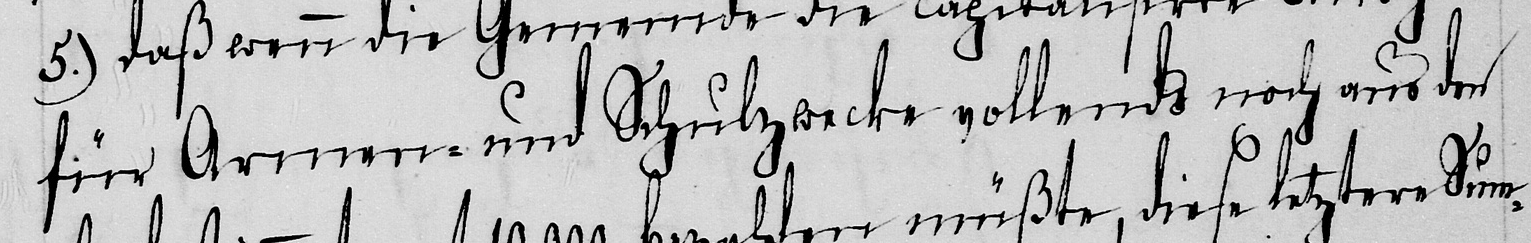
für Armen- und Schulzwecke vollends noch aus den
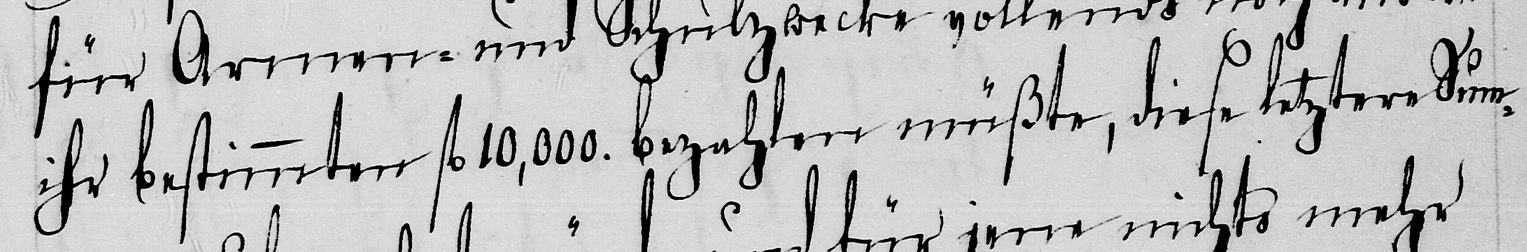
ihr bestimmten fl. 10'000. bezahlen müßte, diese letztere Sum¬
